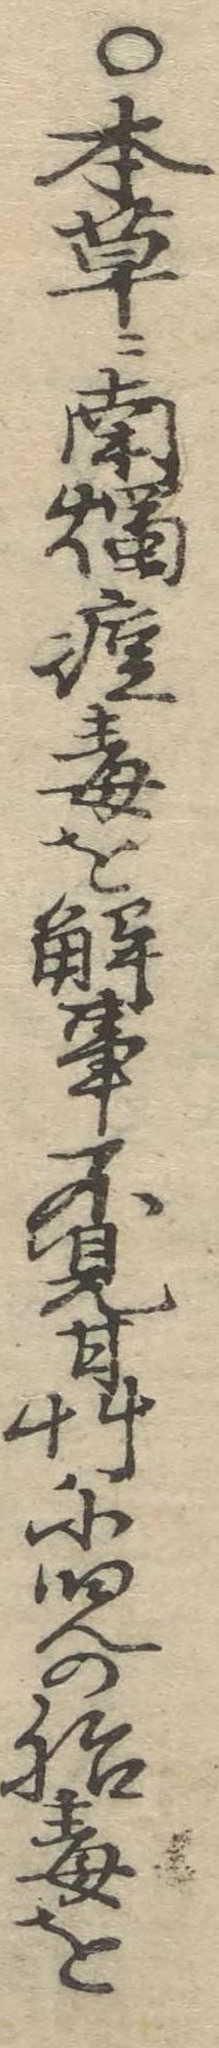○本草に南燭痘毒を解事不見甘草小児の胎毒を
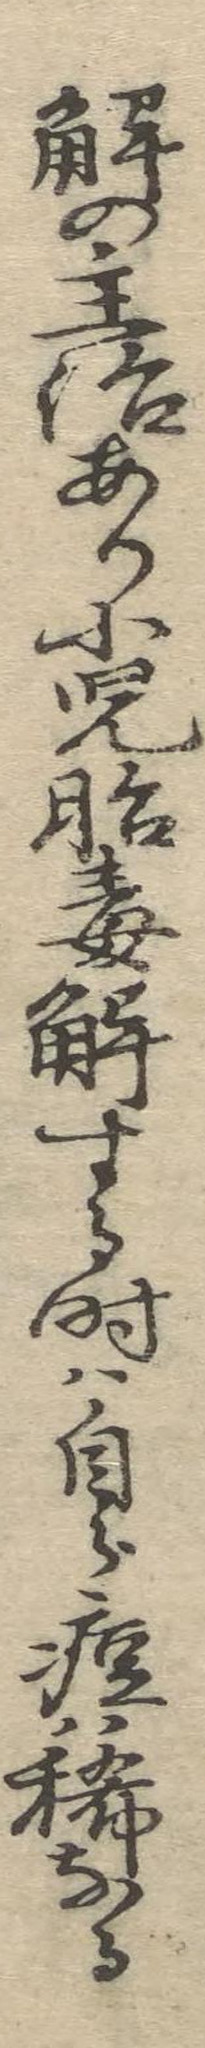解の主治あり小児胎毒解する時は自ら痘は稀なる
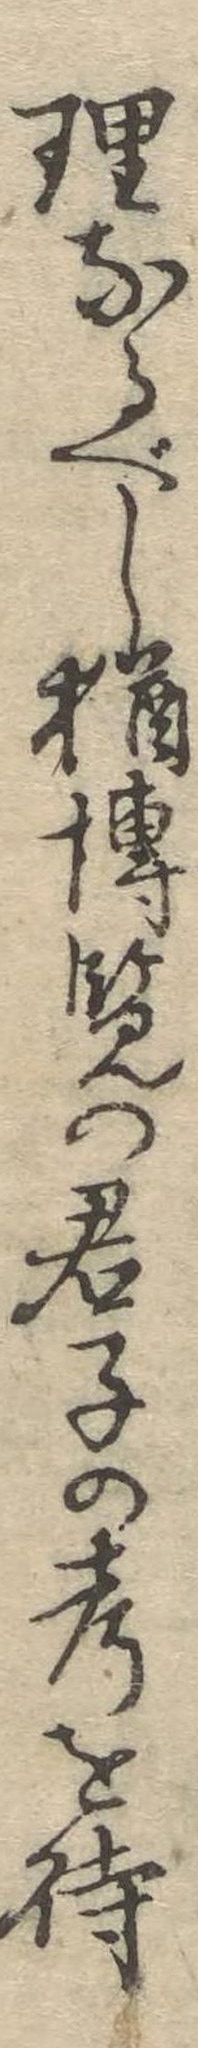理なるべし猶博覧の君子の考を待
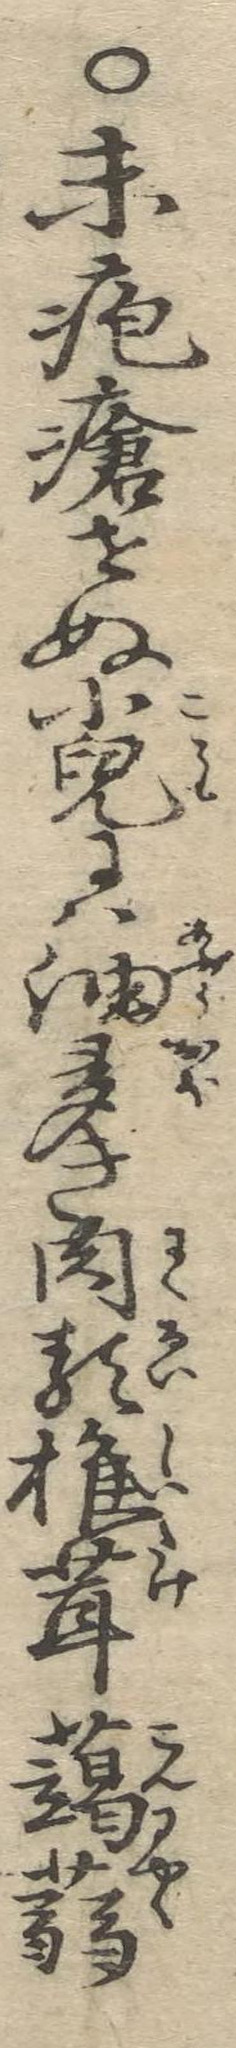○未疱瘡せぬ小児には油多き肉類椎茸蒟蒻
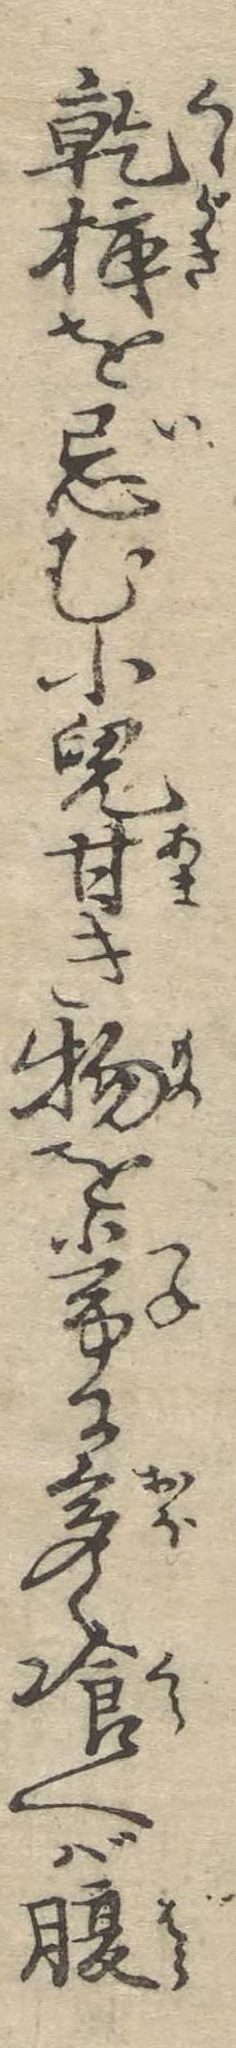乾柿を忌む小児甘き物を常に多く喰へば腹
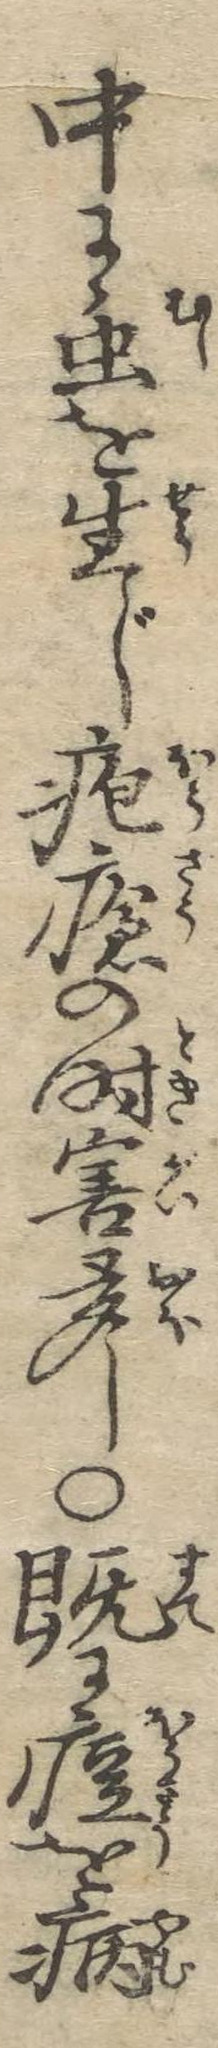中に虫を生じ疱瘡の時害多し○既に痘を病
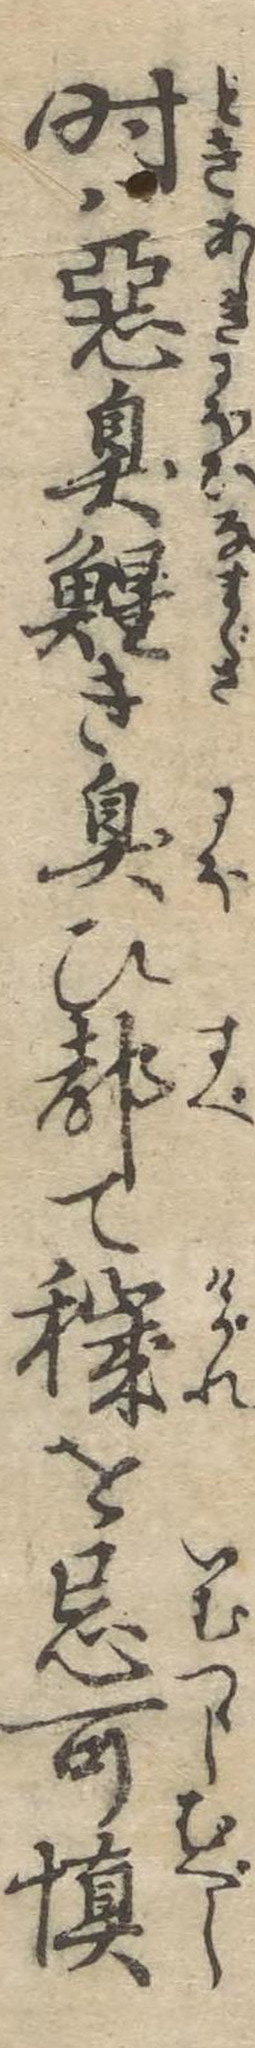時は悪臭鯹き臭ひ都て穢を忌可慎
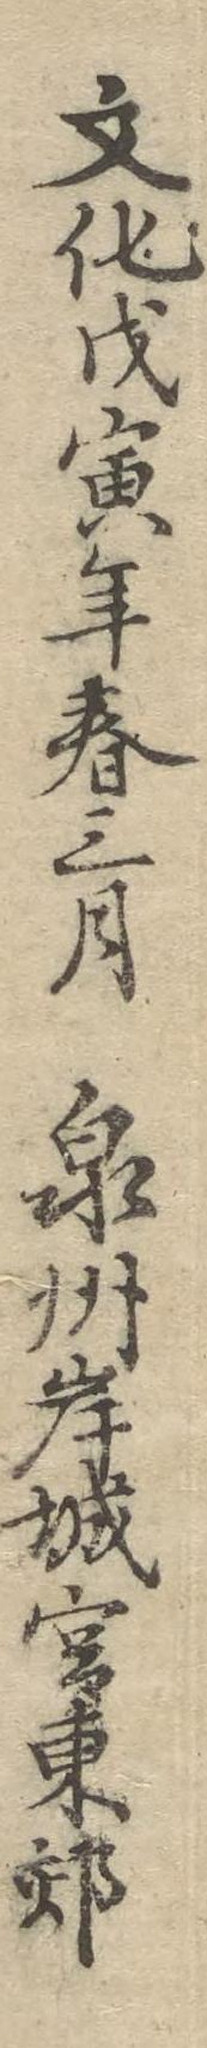文化戊寅年春三月泉州岸城宮東郊
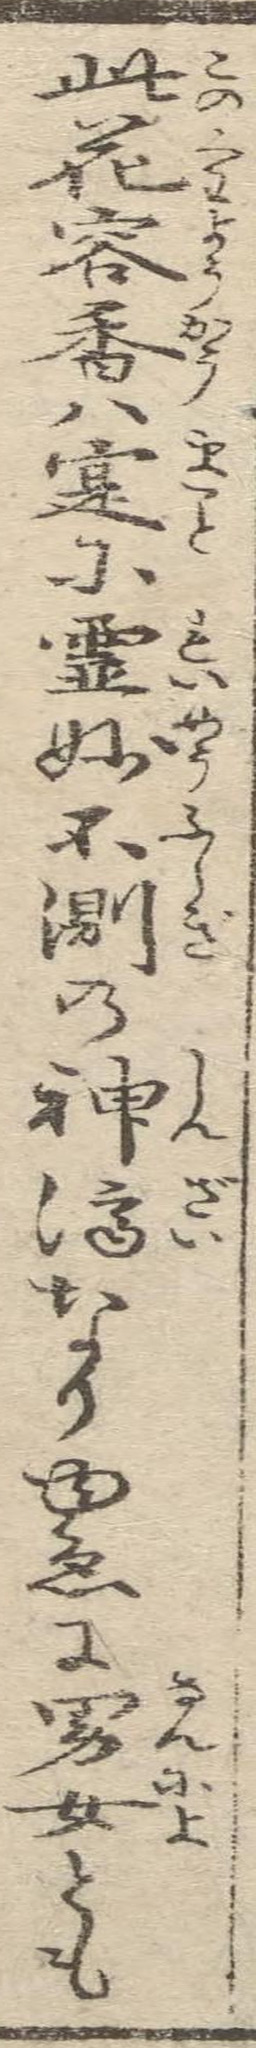此花容香は寔に霊妙不測の神済なりゆゑに男女とも
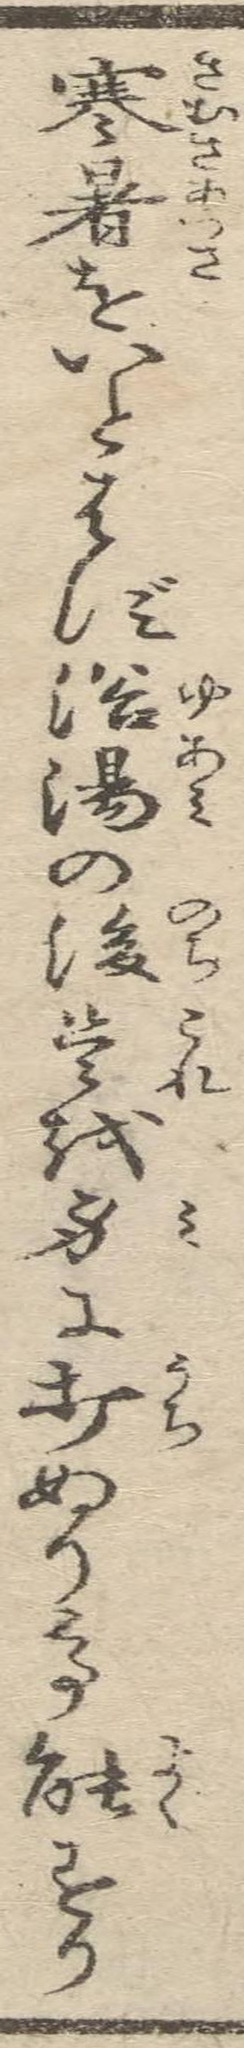寒暑をいとはず浴湯の後是を身に打ぬりて能すり
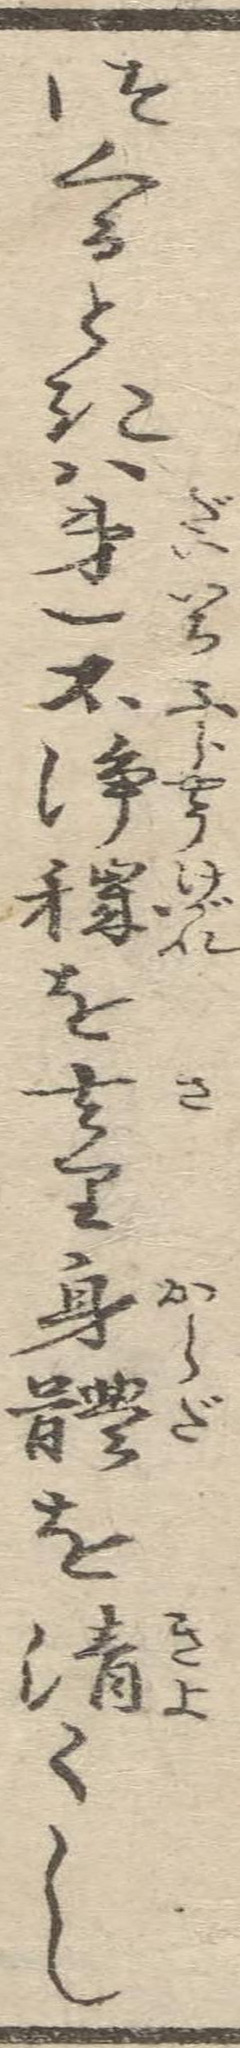つくるときは第一不浄穢を去り身体を清くし
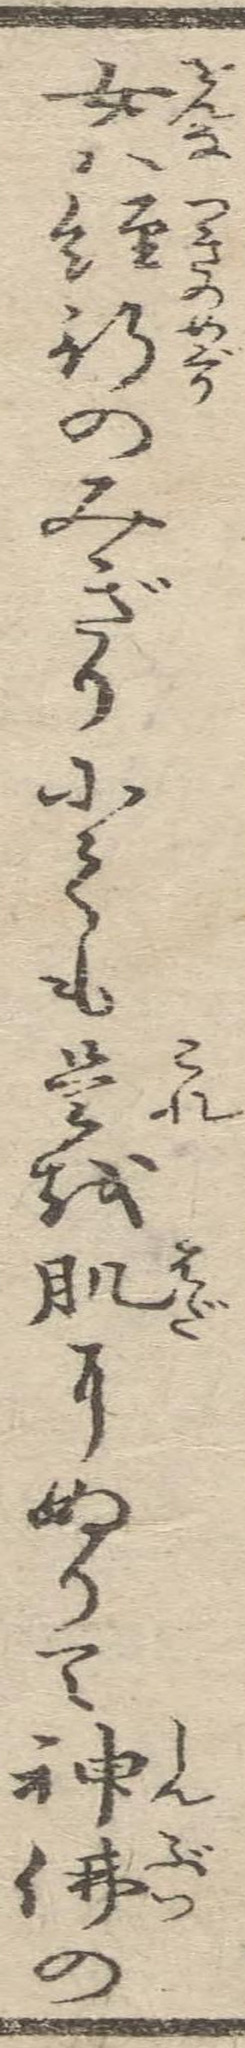女は経行のみぎりにても是を肌にぬりて神仏の
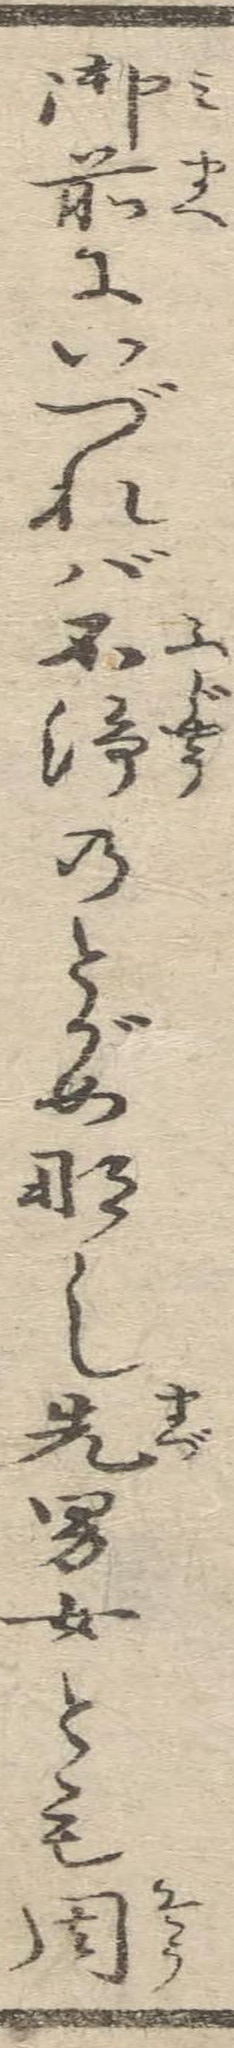御前にいづれば不浄のとがめなし先男女とも周
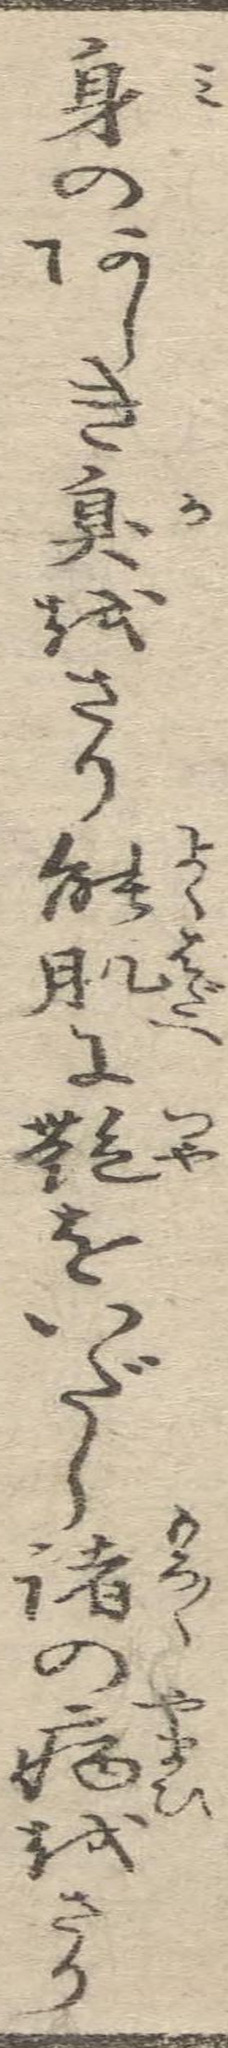身のあしき臭をさり能肌に艶をいだし諸の病をさり
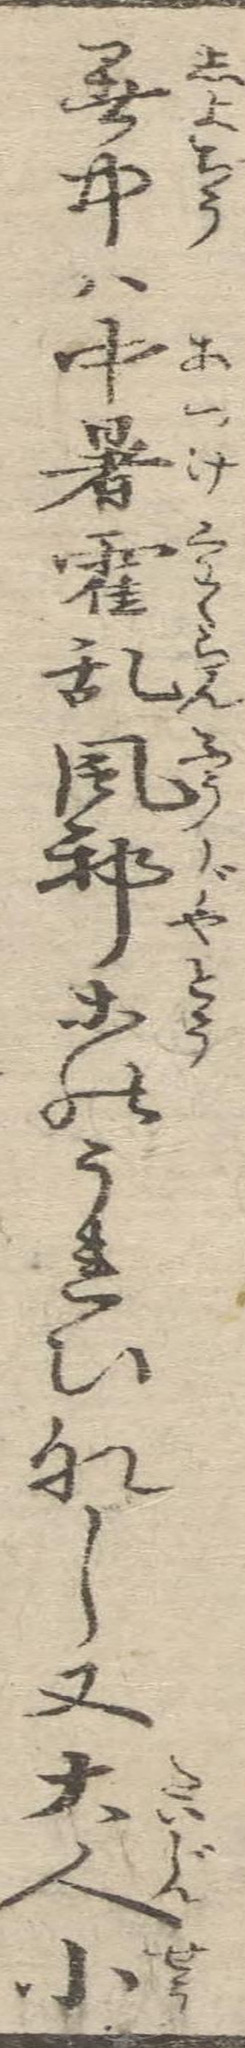暑中は中暑霍乱風邪等のうれいなし又大人小
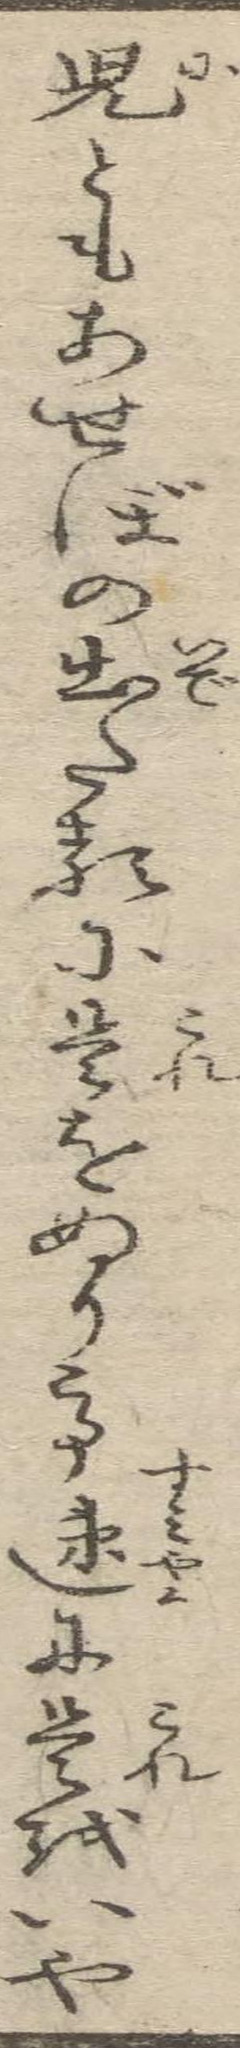児ともあせぼの出たるに是をぬりて速に是をいや
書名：浪華薬種問屋能書張交帖. 二
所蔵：国立国会図書館 National Diet Library, JAPAN
